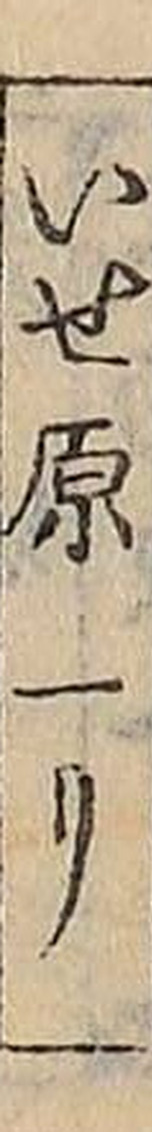いせ原一リ
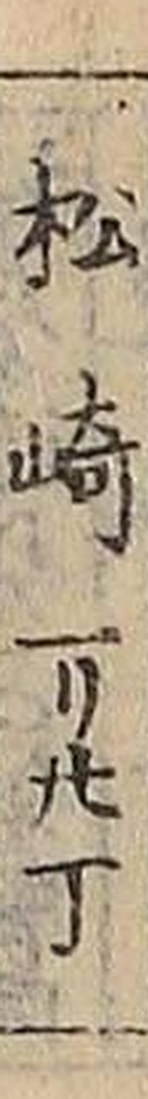松崎一リ廿丁
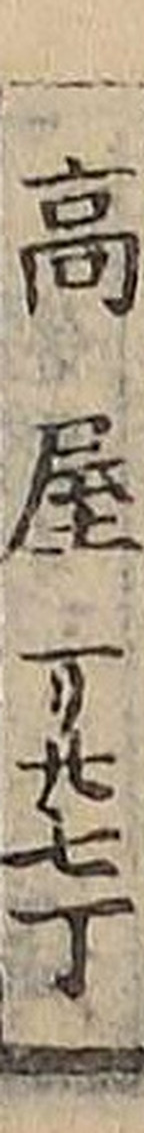高屋一リ廿七丁
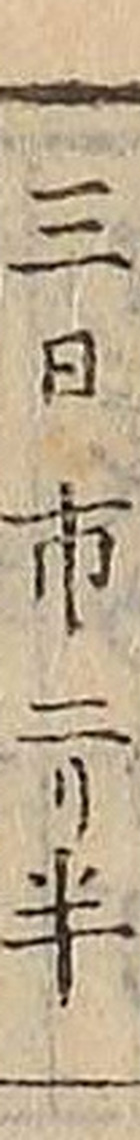三日市二リ半
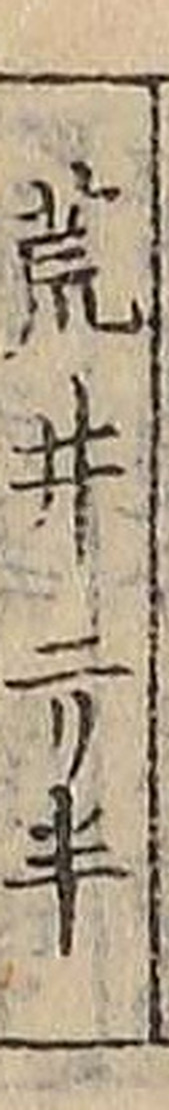荒井二リ半
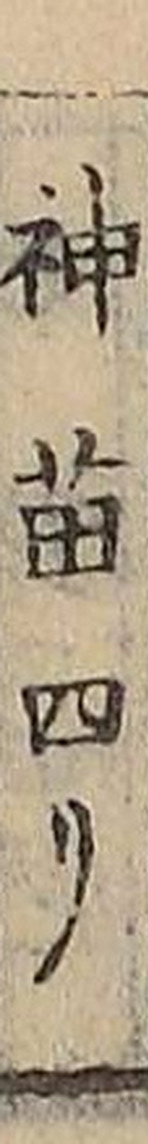神苗四リ
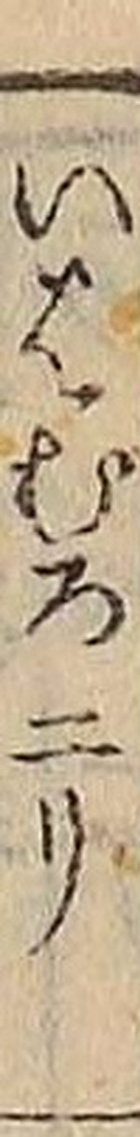いはむろ二リ
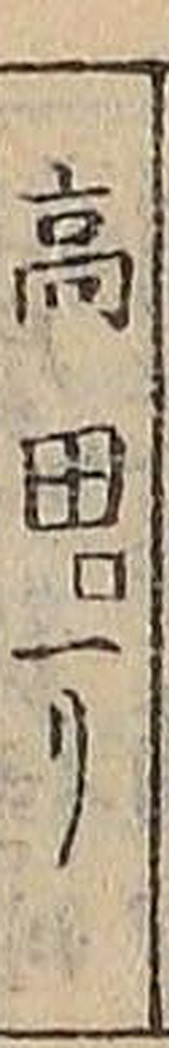高田▫一リ
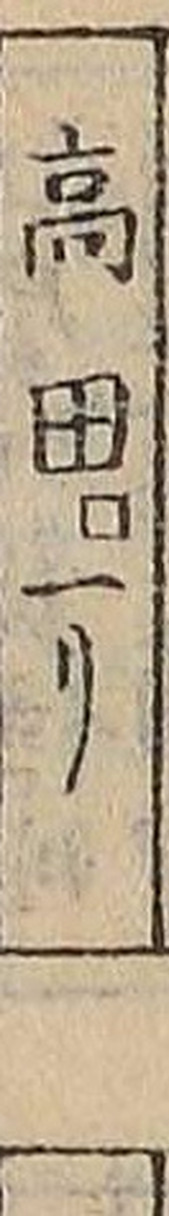高田▫一リ
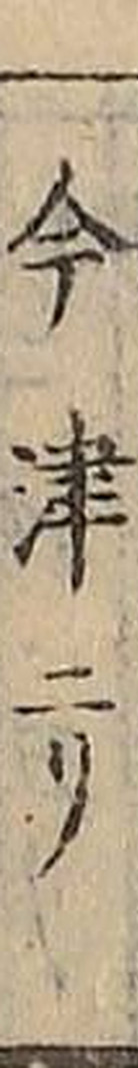今津二リ
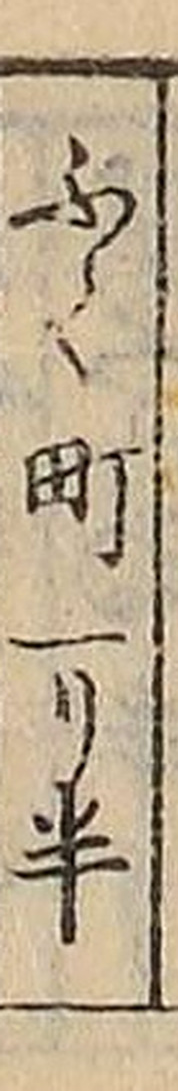ふく町一リ半
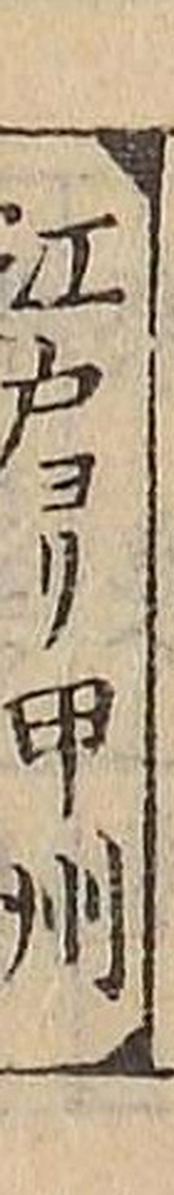江戸ヨリ甲州
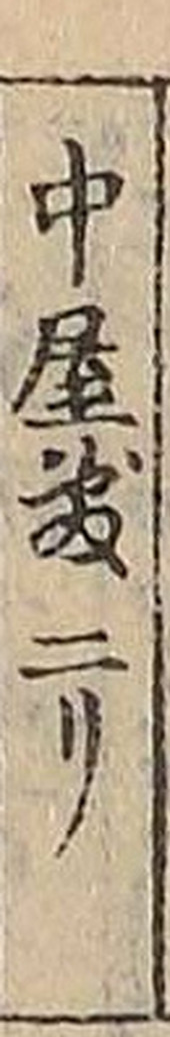中屋敷二リ
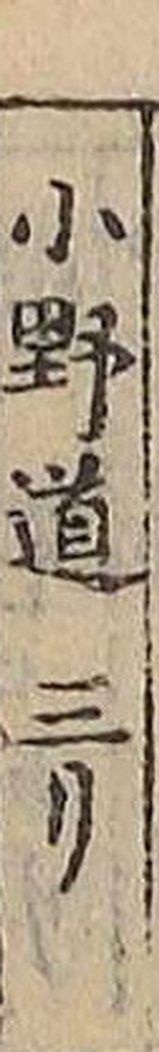小野道三リ
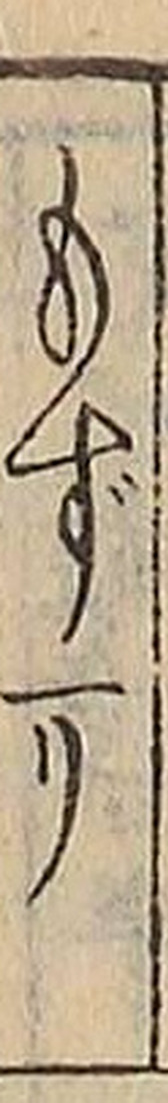もず一リ
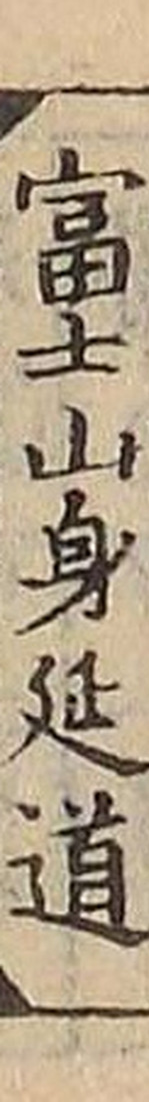富士山身延道
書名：旅行用心集
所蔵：神戸大学附属図書館 国文学研究資料館
